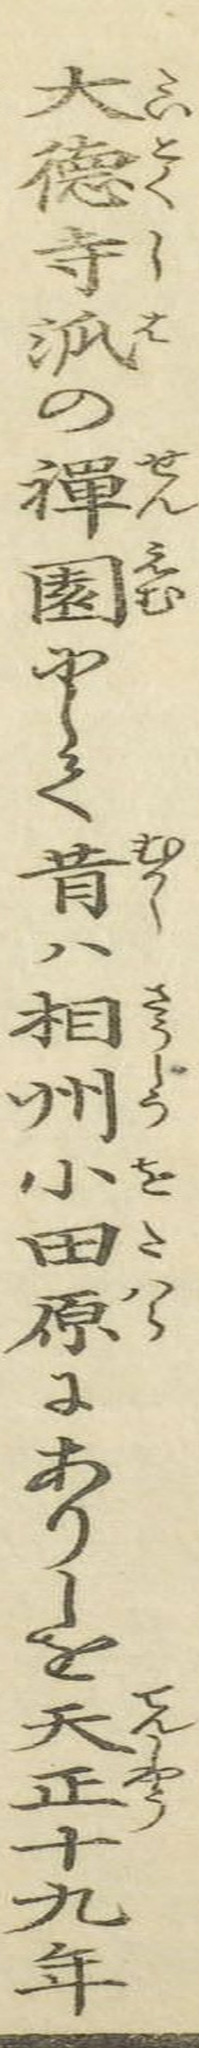大徳寺派の禪園にして昔は相州小田原にありしを天正十九年
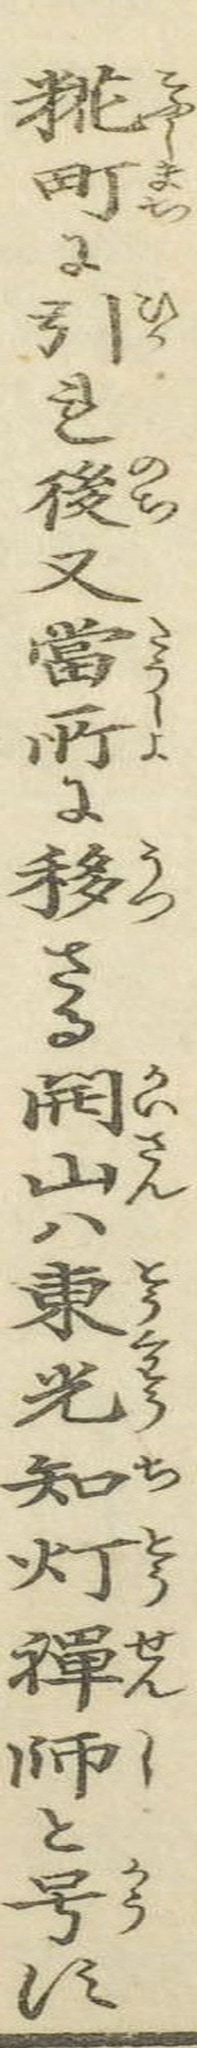糀町に引れ後又當所に移さる開山は東光知灯禪師と号す
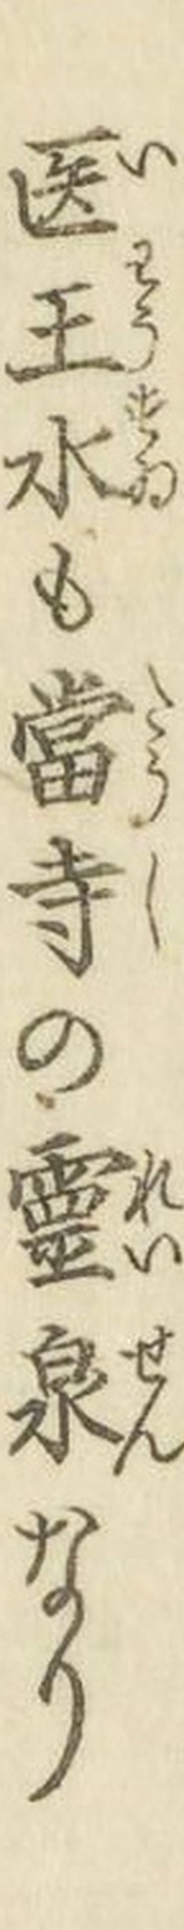医王水も當寺の靈泉なり
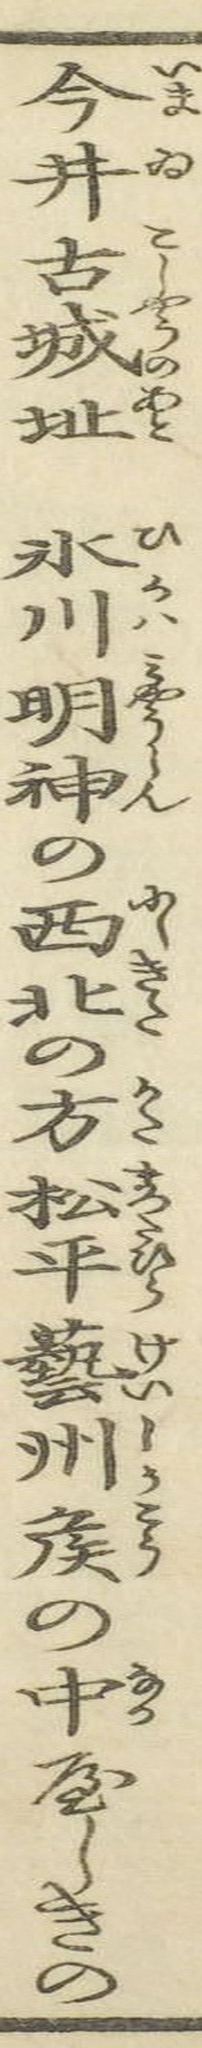今井古城址氷川明神の西北の方松平藝州矦の中やしきの
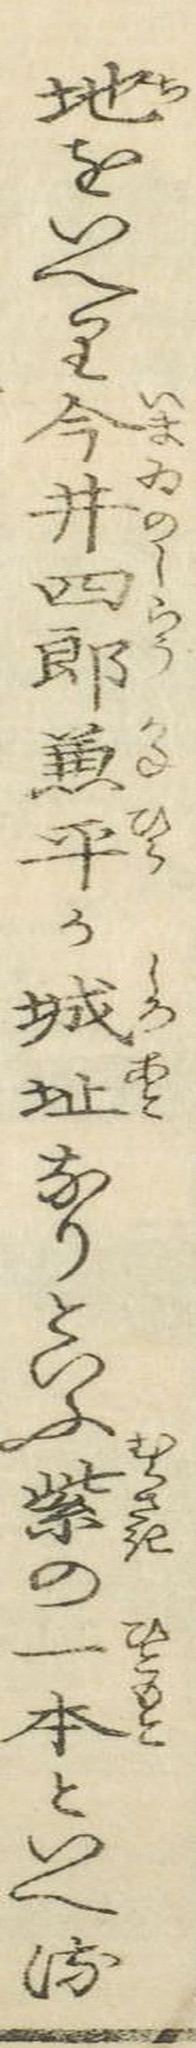地をいへり今井四郎兼平か城址なりといふ紫の一本といへる
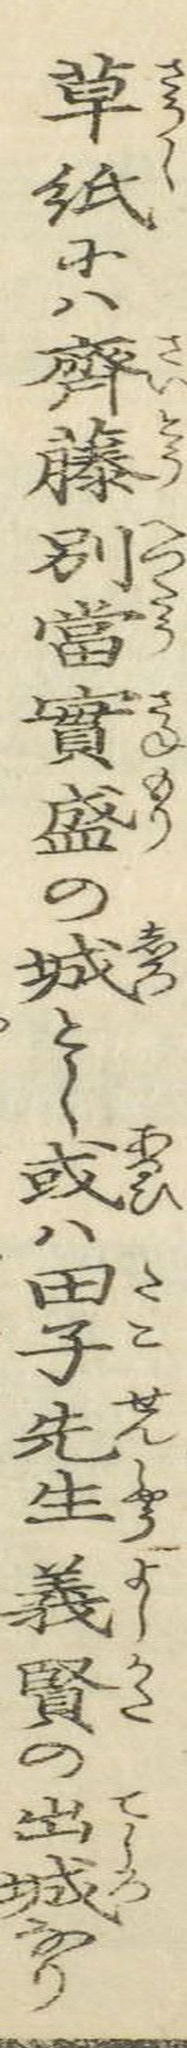草紙には斎藤別當實盛の城とし或は田子先生義賢の出城なり
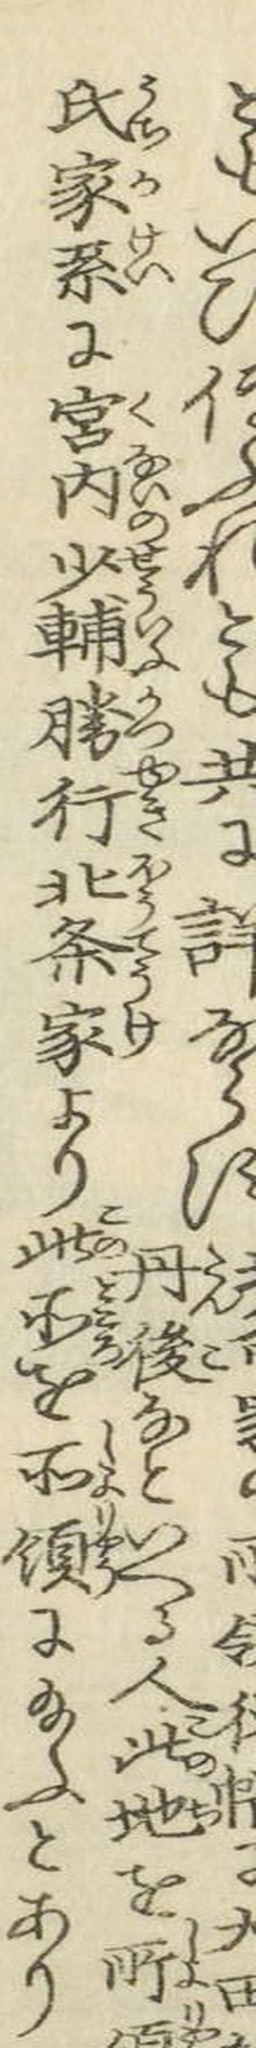氏家系に宮内少輔勝行北条家より此所を所領に給ふとあり
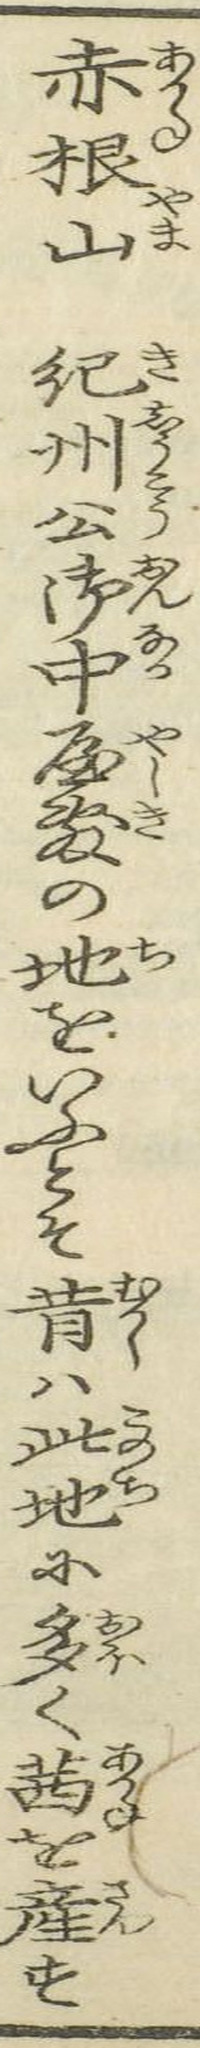赤根山紀州公御中屋敷の地をいふとそ昔は此地に多く茜を産す
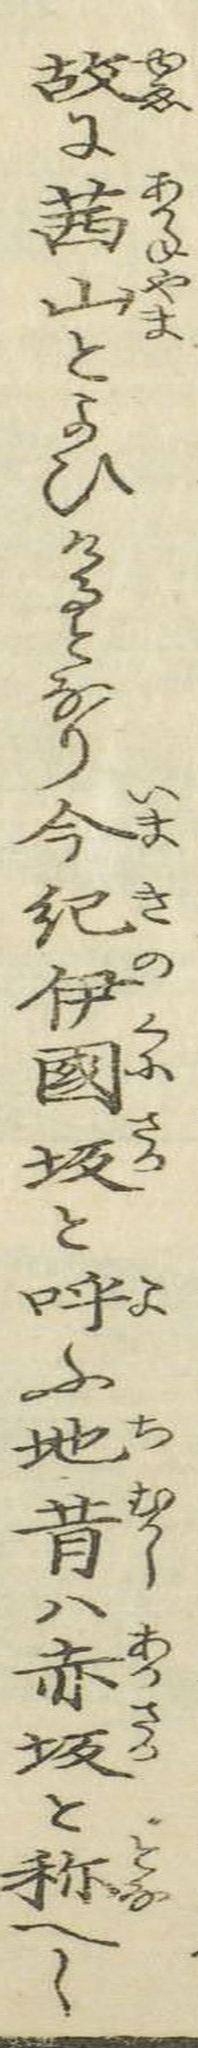故に茜山とよひけるとなり今紀伊國坂と呼ふ地昔は赤坂と称へし
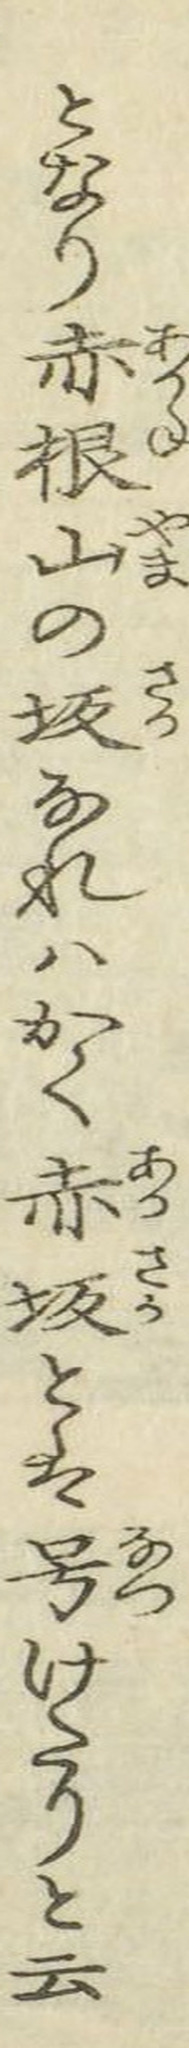となり赤根山の坂なれはかく赤坂とは号けたりと云
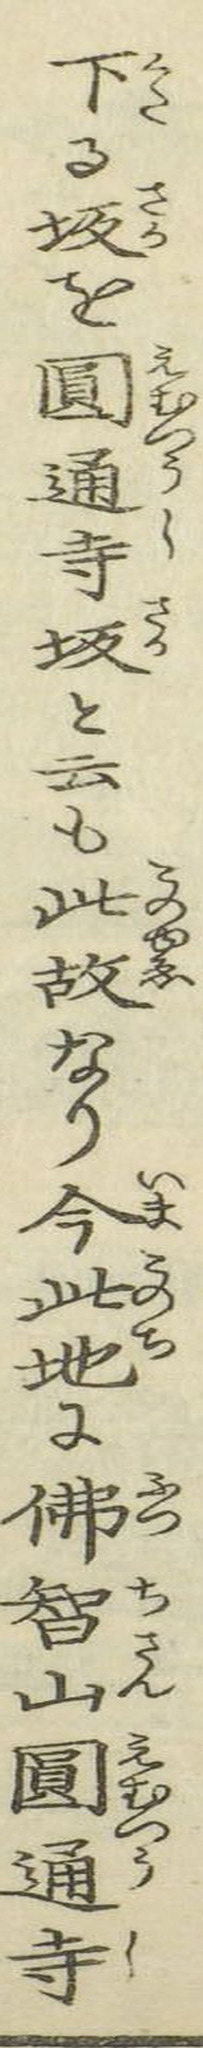下る坂を圓通寺坂と云も此故なり今此地に佛智山圓通寺
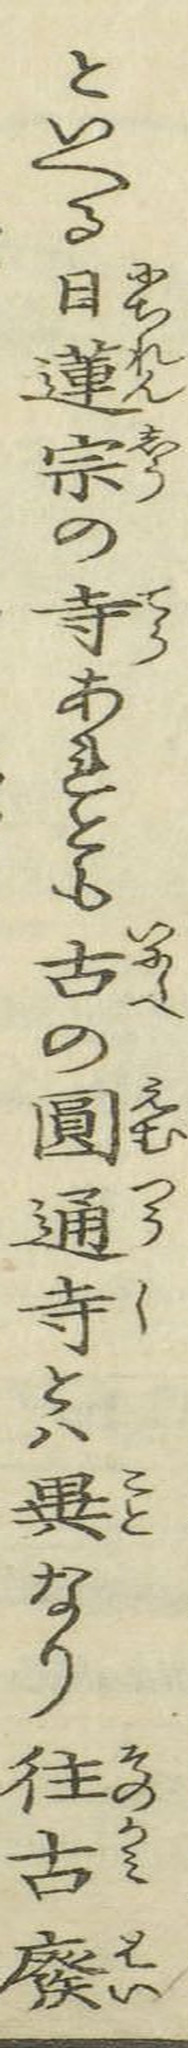といへる日蓮宗の寺あれとも古の圓通寺とは異なり往古廢
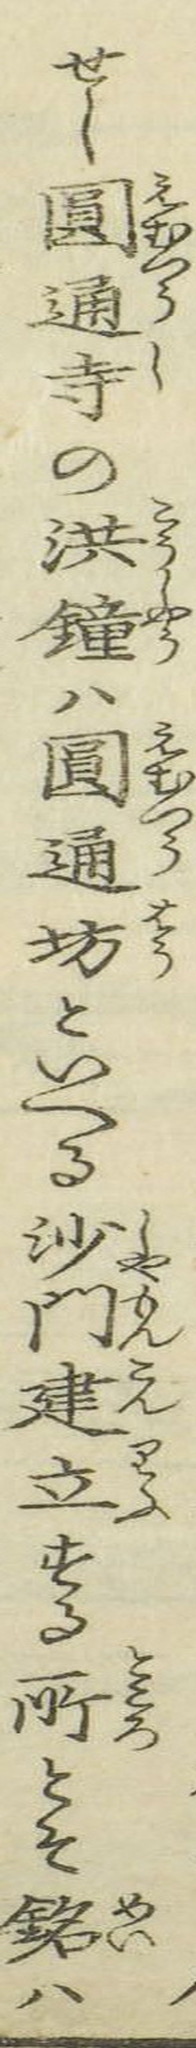せし圓通寺の洪鐘は圓通坊といへる沙門建立する所とそ銘は
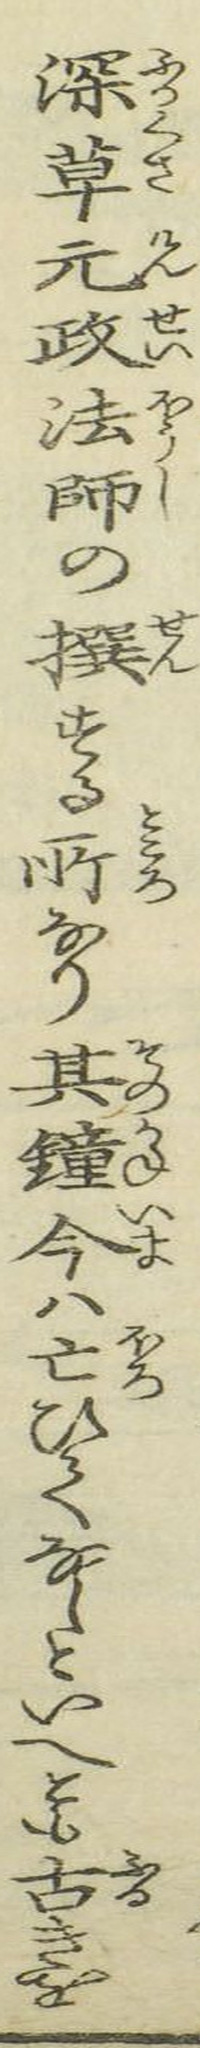深草元政法師の撰する所なり其鐘今は亡ひてなしといへとも古きを
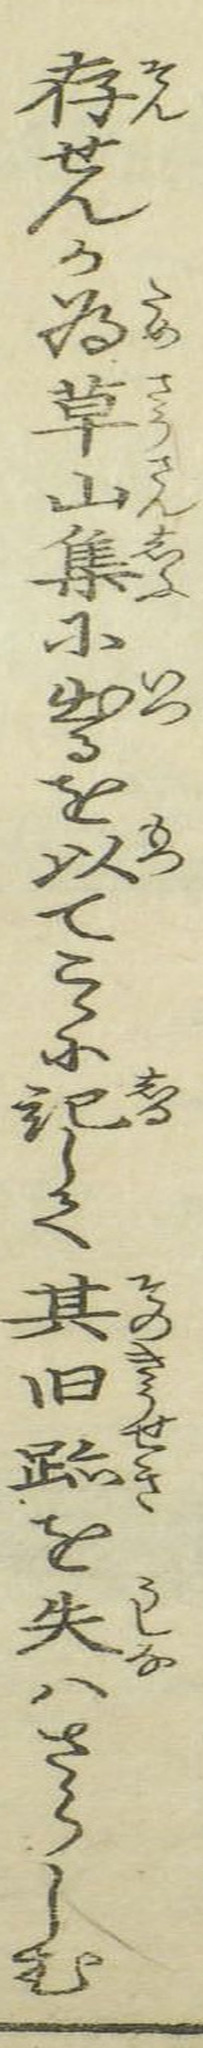存せんか為草山集に出るを以てこゝに記して其旧跡を失はさらしむ

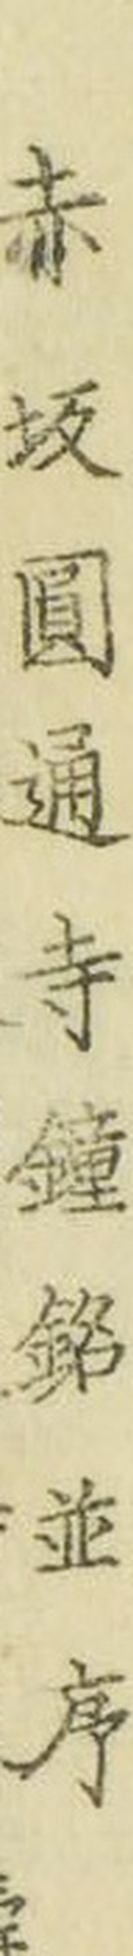赤坂圓通寺鐘銘並序
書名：江戸名所図会 20巻 巻之8
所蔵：東京学芸大学教育コンテンツアーカイブ
